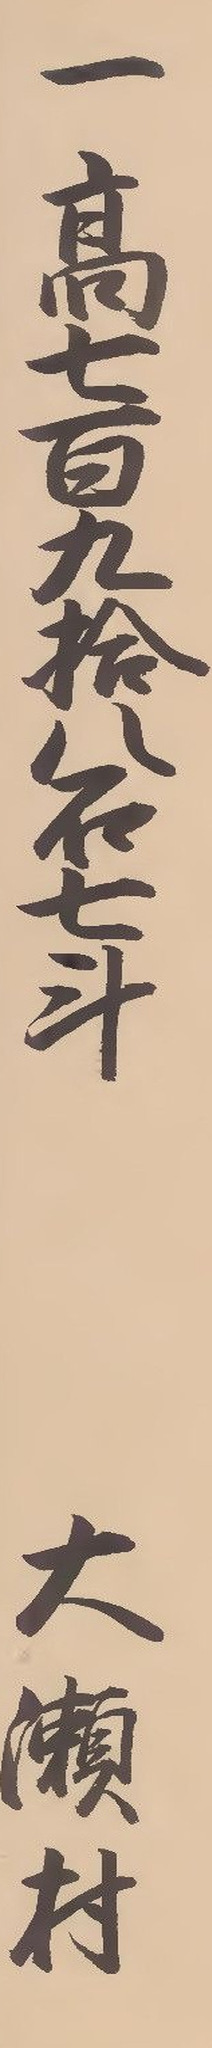一高七百九拾八石七斗大瀬村
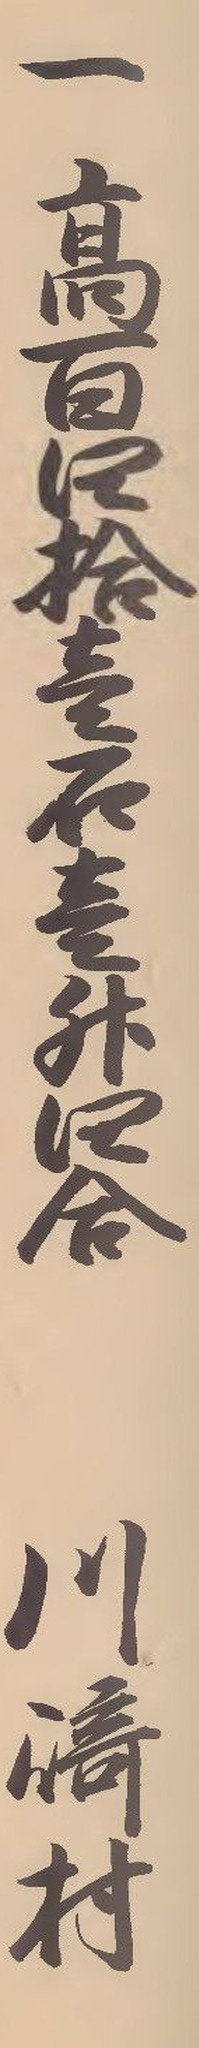一高百四拾壱石壱升四合川崎村
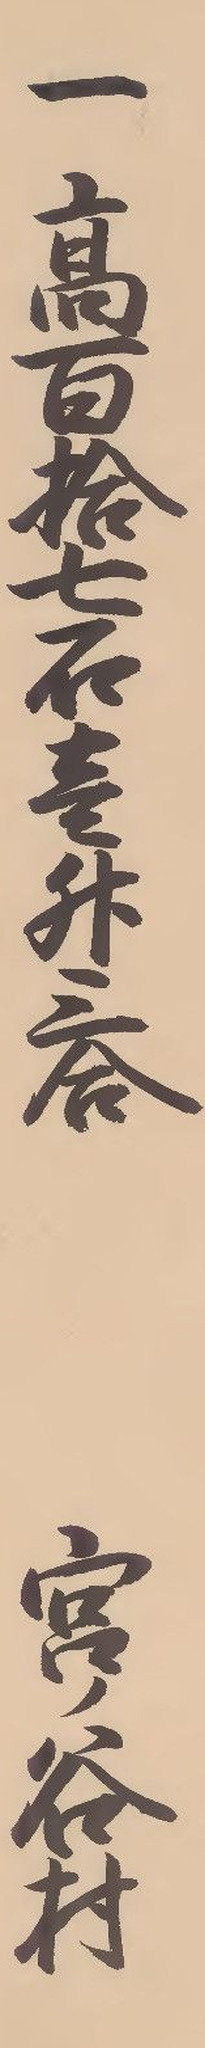一高百拾七石壱升三合宮ノ谷村
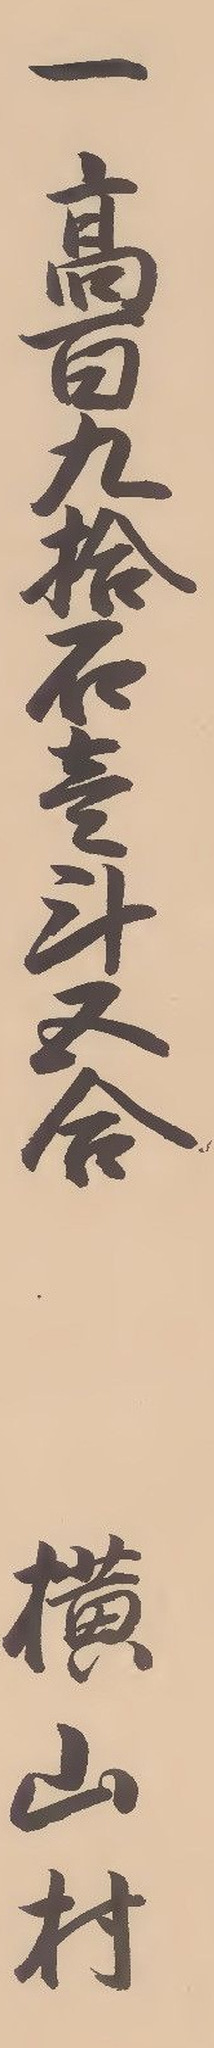一高百九拾石壱斗五合横山村
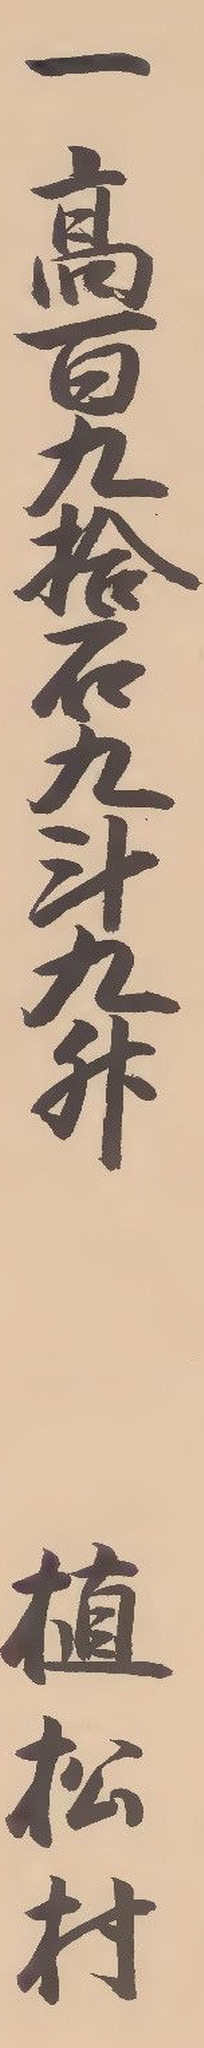一高百九拾石九斗九升植松村

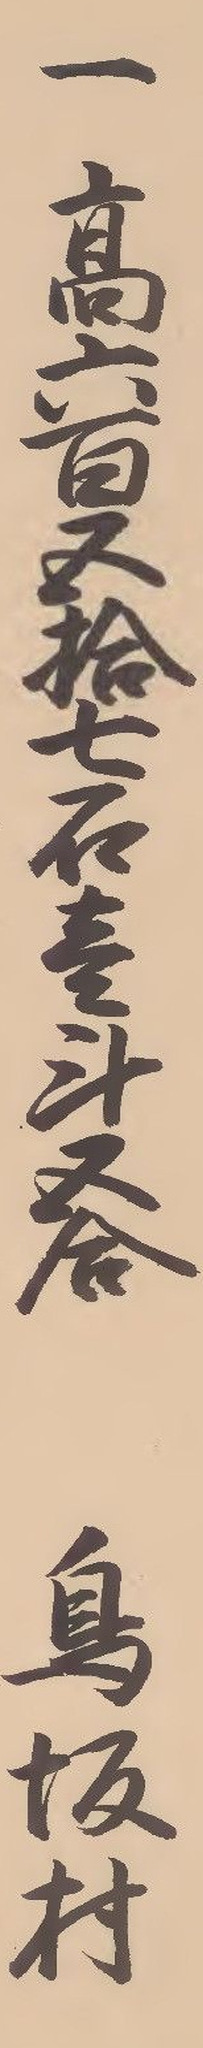一高六百五拾七石壱斗五合鳥坂村
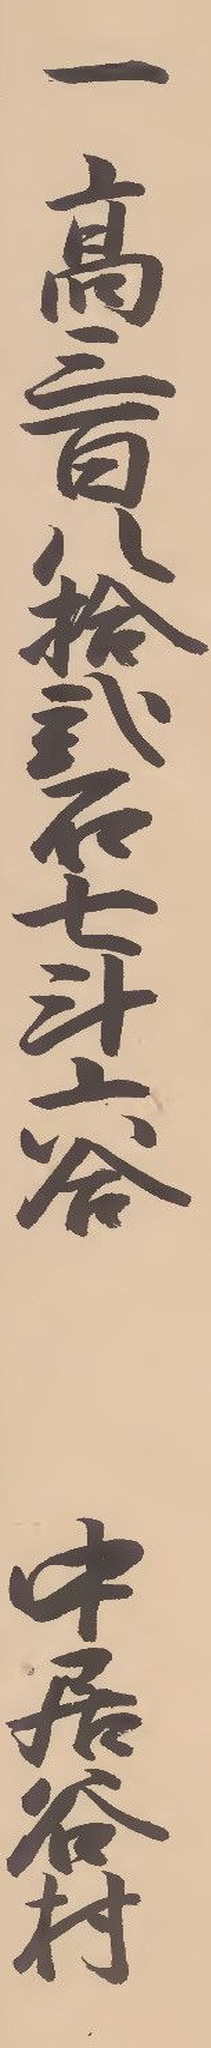一高三百八拾弐石七斗六合中居谷村
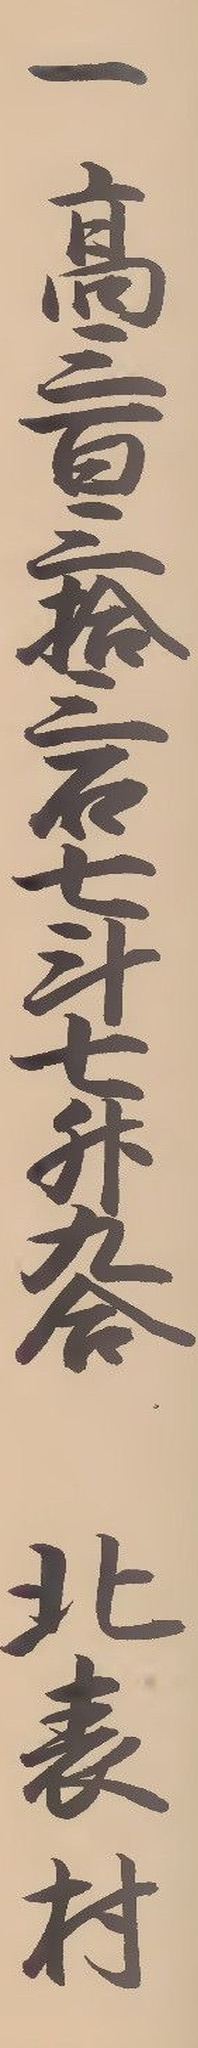一高三百三拾三石七斗七升九合北表村
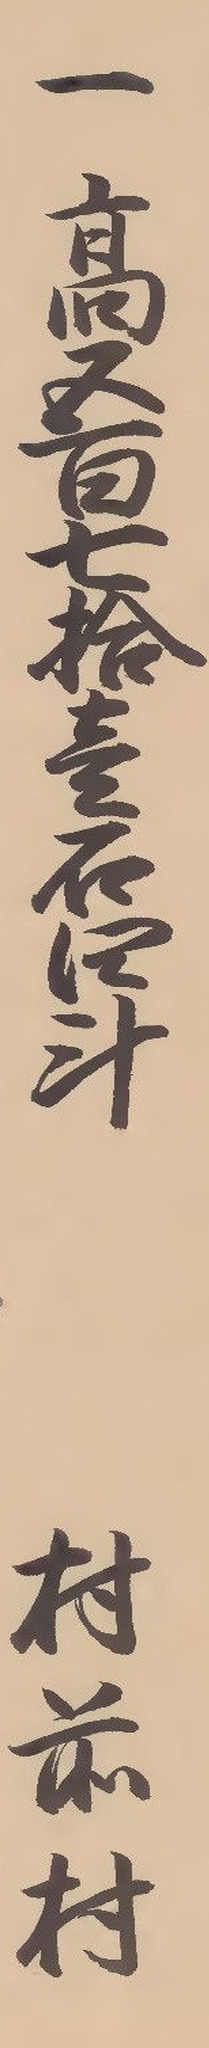一高五百七拾壱石四斗村前村
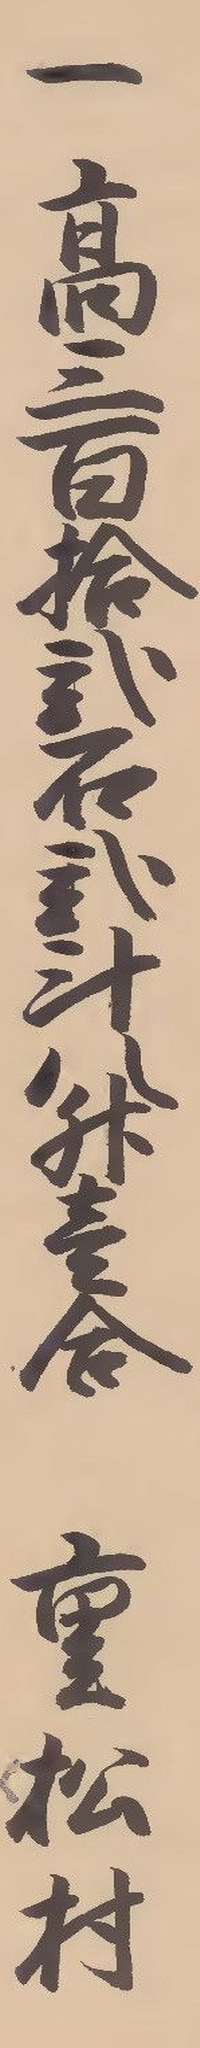一高三百拾弐石弐斗八升壱合重松村

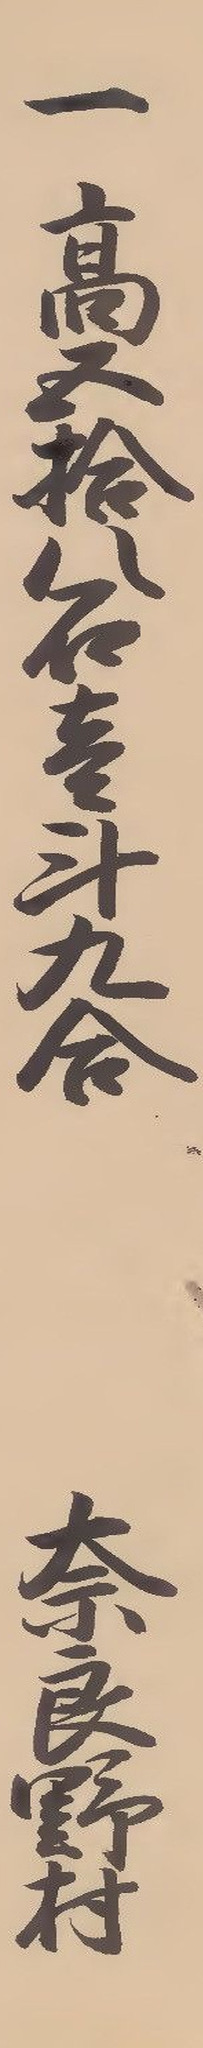一高五拾八石壱斗九合奈良野村
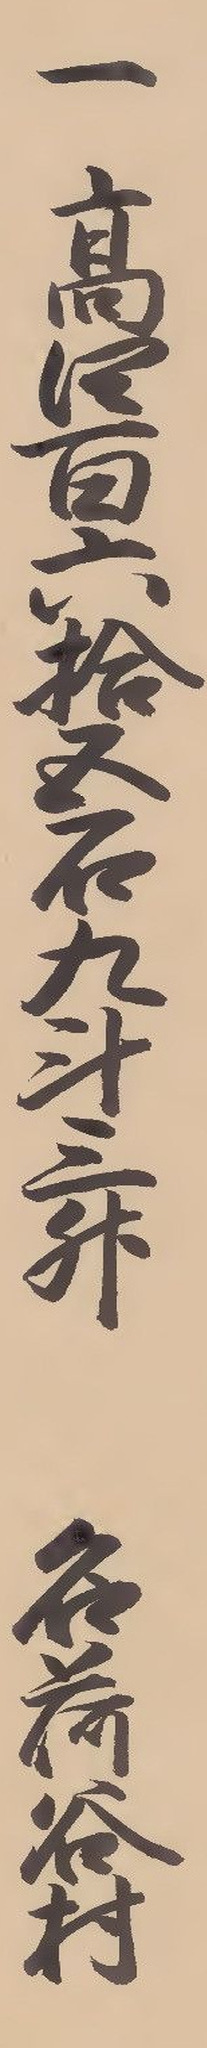一高四百六拾五石九斗三升名荷谷村
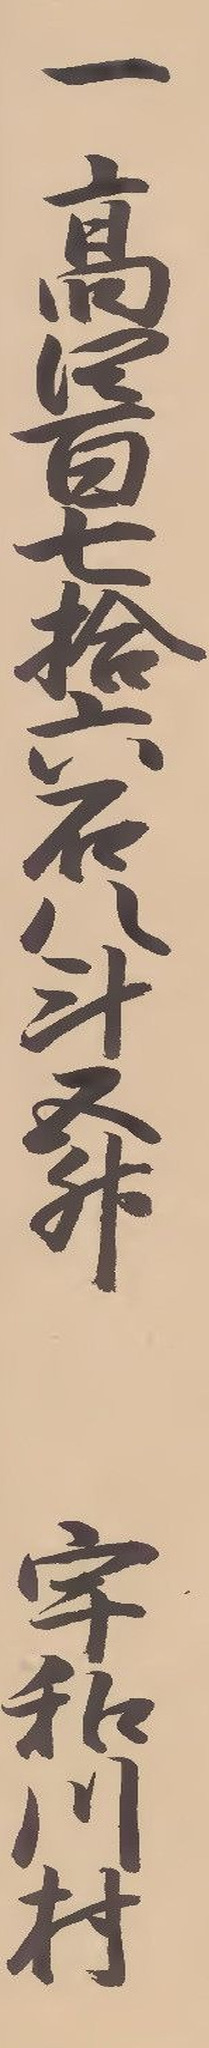一高四百七拾六石八斗五升宇和川村
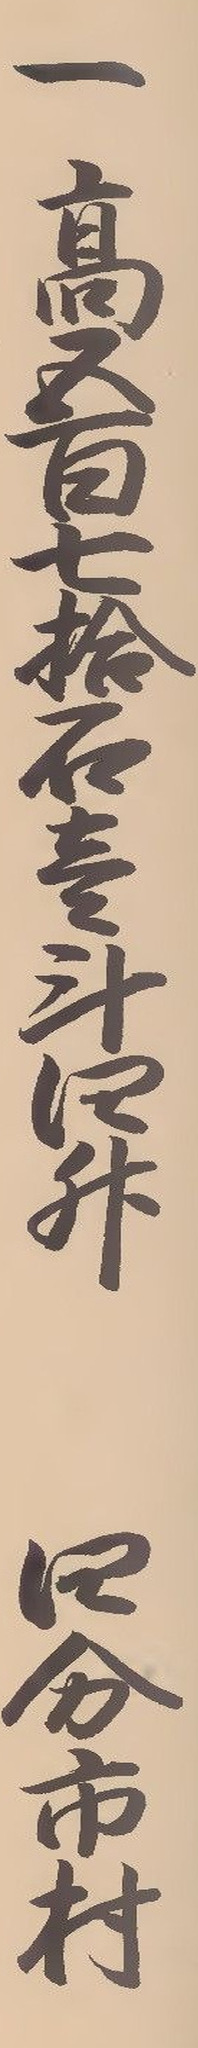一高五百七拾石壱斗四升四分市村
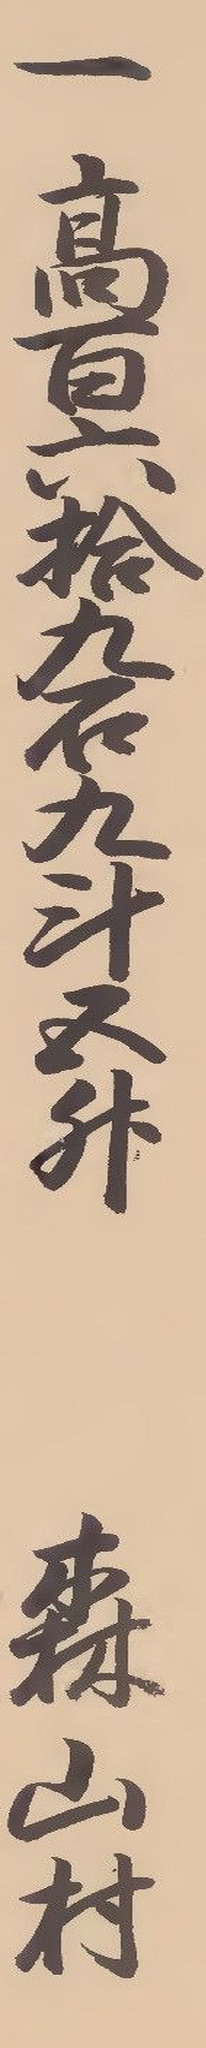一高百六拾九石九斗五升森山村
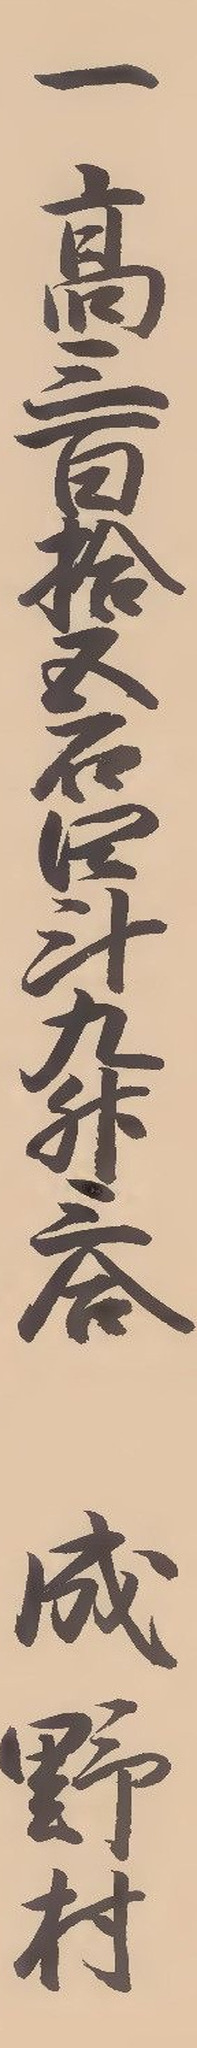一高三百拾五石四斗九升三合成野村
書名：伊予国郷帳
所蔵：国立公文書館 National Archives of Japan
